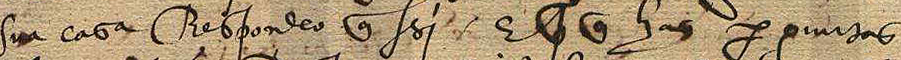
sua casa Respondeo q̄ ssj / E p̄oq̄ as ꝑguntas
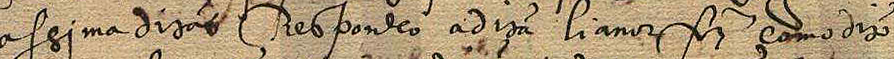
assjma ditas Respondeo a ditā lianor frz̄ como ditō
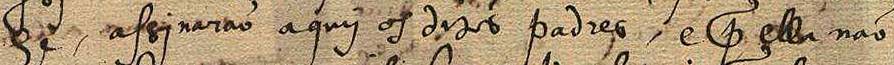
he / assjnaraão aquj os ditos padres / e p̄o ella naō
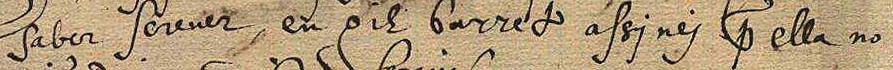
saber screuer / eu gil barreto assjnej p̄o ella no
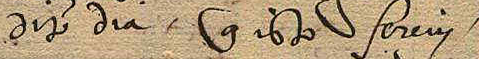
ditō dia / q̄ isto screuj /
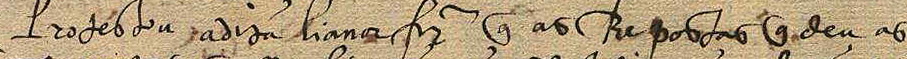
Protestou a ditā lianor frz̄ q̄ as Repostas q̄ deu as
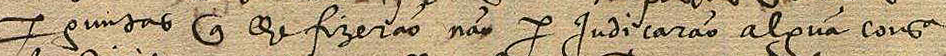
ꝑguntas q̄ lhe fizeraõ não ꝑJudicarão alguā cousa
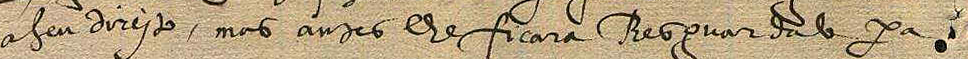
a seu direjto / mas antes lhe ficara Resguardado ꝑa
